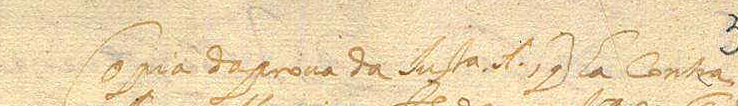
Copia da proua da Iusta A., q̄ ha Contra
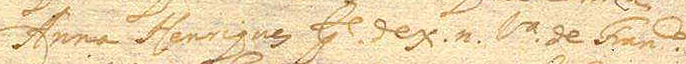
Anna Henriques pte. de x. n. V.a de Fran.Co
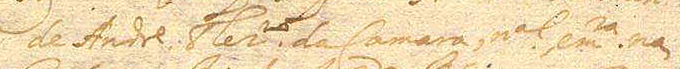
de Andre Thez.o da Camara, nal e mra. na
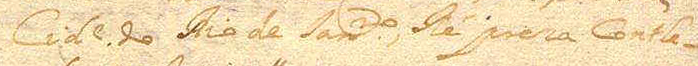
Cide. do Rio de Ian.ro, Ré preza Conthe
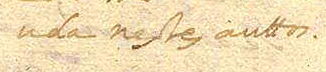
uda nestes auttos.
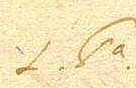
1. Ta.
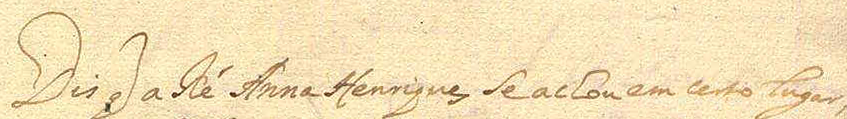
Dis q̄ a Ré Anna Henriques se achou em certo lugar,
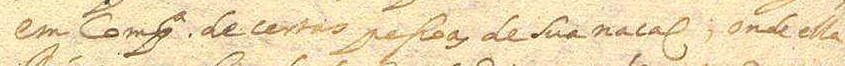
em Compa. de certas pessoas de sua naçā, onde ella
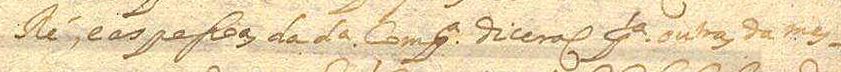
Ré, e as pessoas da da. Comp.a dicerā p.a. outras da mes
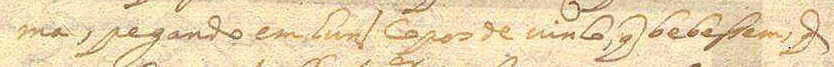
ma, pegando em huns Copos de uinho, q̄ bebessem, q̄
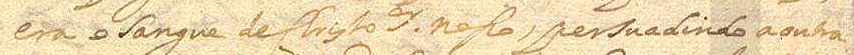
era o sangue de Christo sor. nosso, persuadindo a outra
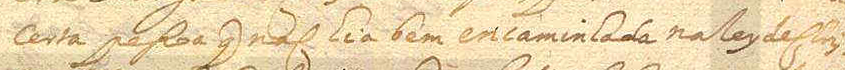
certa pessoa q̄ nā hia bem encaminhada na ley de Chris
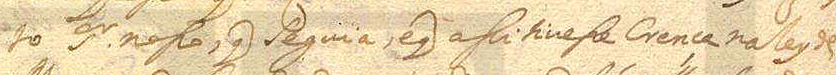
to sor. nosso, q̄ seguia, e q̄ assi tiuesse crença na ley de
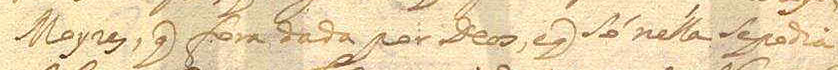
Moyzes, q̄ fora dada por Deos, e q̄ só nella se podia
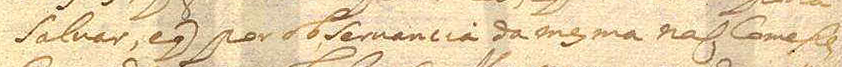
saluar, e q̄ por obseruancia da mesma nā Comesse
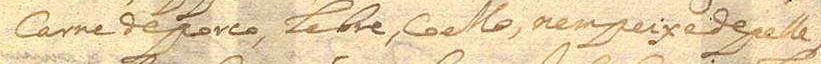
Carne de porco, Lebre, Coelho, nem peixe de pelle
